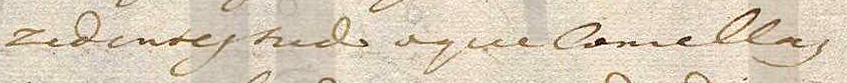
zedentes tudo o que com ellas
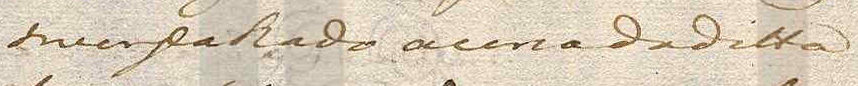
tiver passado a cena da ditta
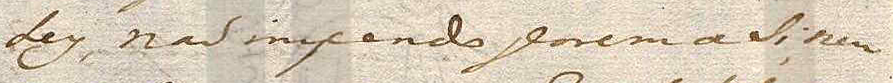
Ley, naõ impondo porem a Si, nem
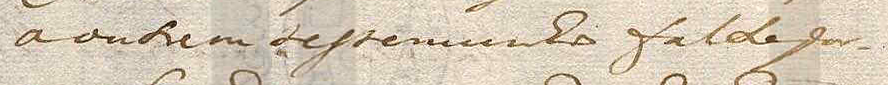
a outrem testemunho falso por
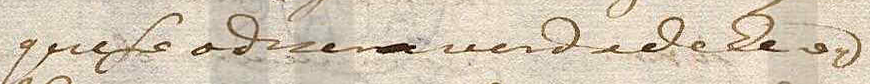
que se o dizer _ verdade he o q̄
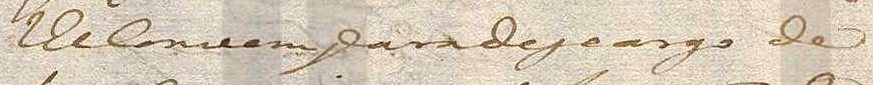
lhe convem para descargo de
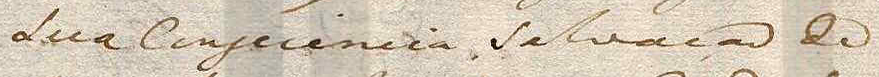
sua consciencia, salvaçaõ de
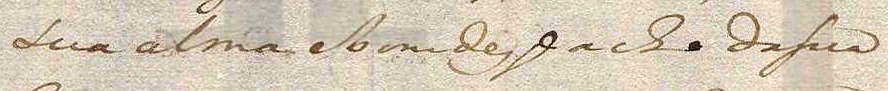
sua alma e bom despacho da sua
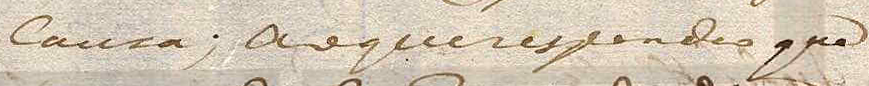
cauza; ao que respendeo que
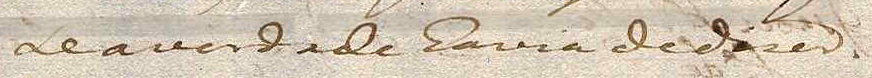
se a verdade havia de dizer.
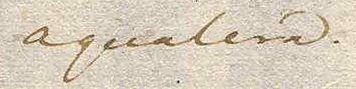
a qual era.
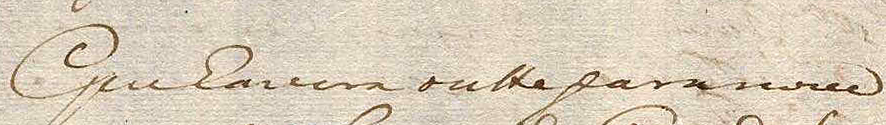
E que havera outto para noue
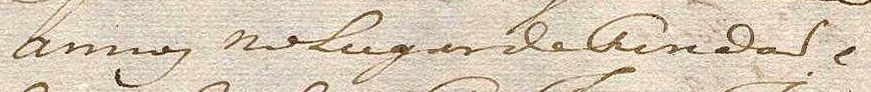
annos no Lugar do Fundaõ e
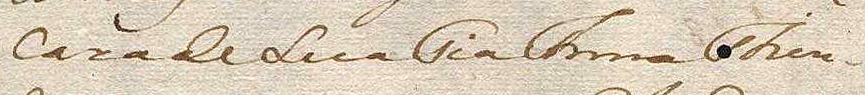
caza de sua Tia Anna Men
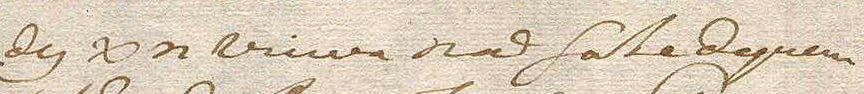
des xn viuva naõ sabe de quem
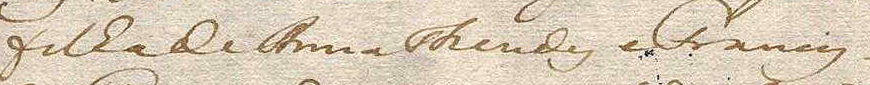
filha de Anna Mendes e Francis
